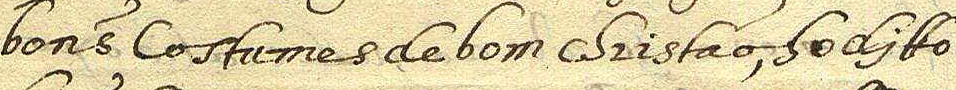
bons̄ Costumes de bom christaõ, ho djtto
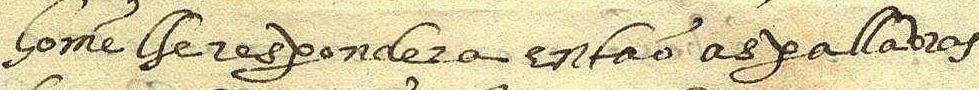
homē lhe respondera Entaõ as pallavras
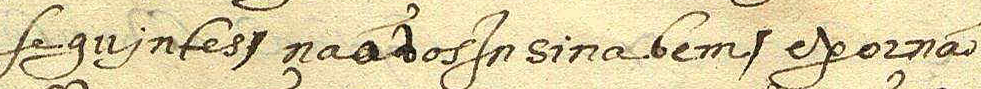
segujntes / naõ vos Jnsina bem/ e por naõ
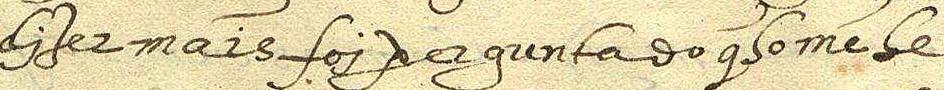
djzer mais foj perguntado q̄ homē he
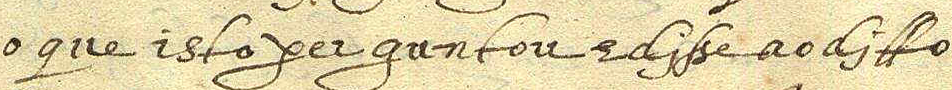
o que isto perguntou E djsse ao djtto
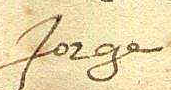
Jorge
